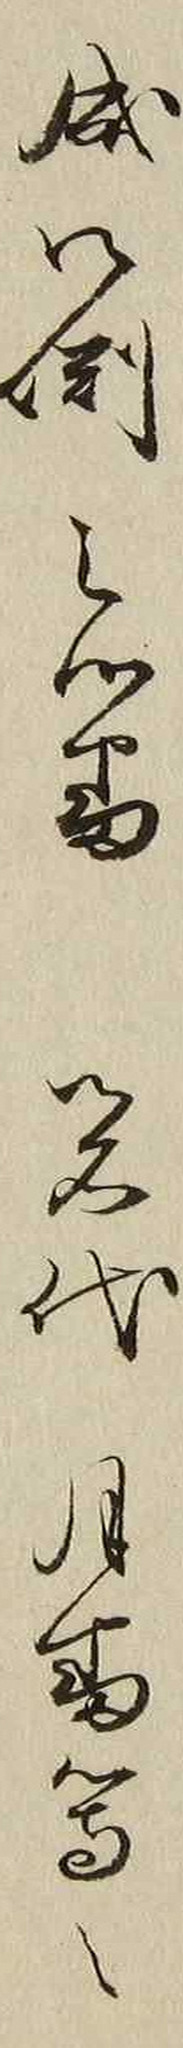成御側之御番御名代月番等之
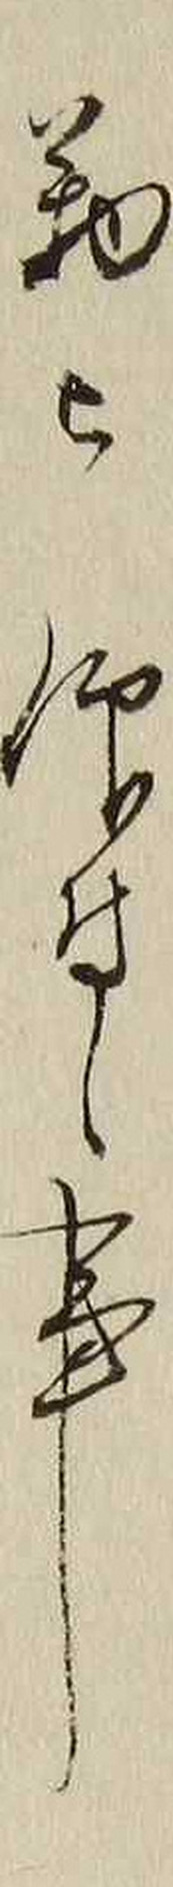勤被仰付候事
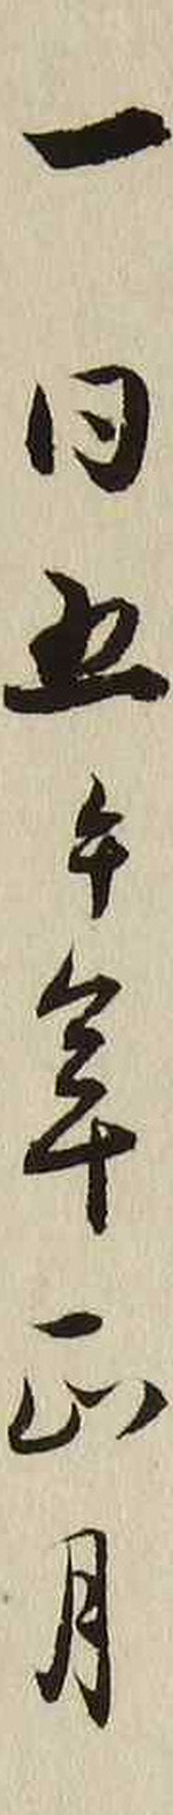一同五午年正月
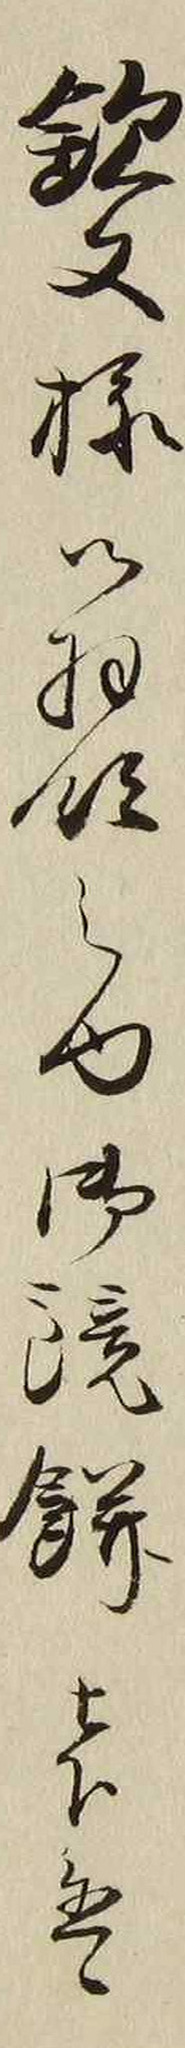欽文様御拝領之内御鏡餅被下置候
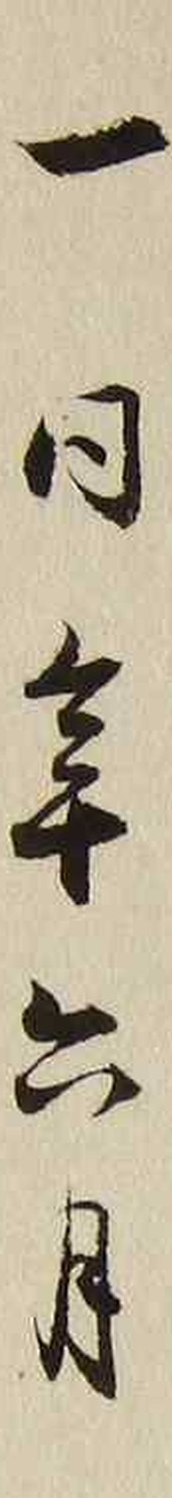一同年六月
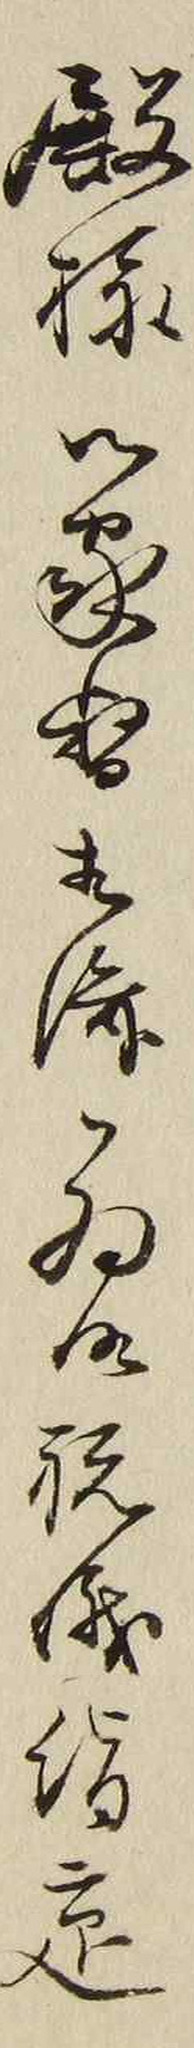殿様御家督相済候為御祝儀絹二疋
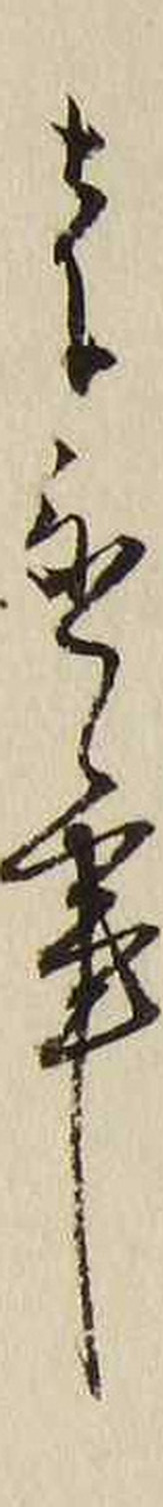被下置候事

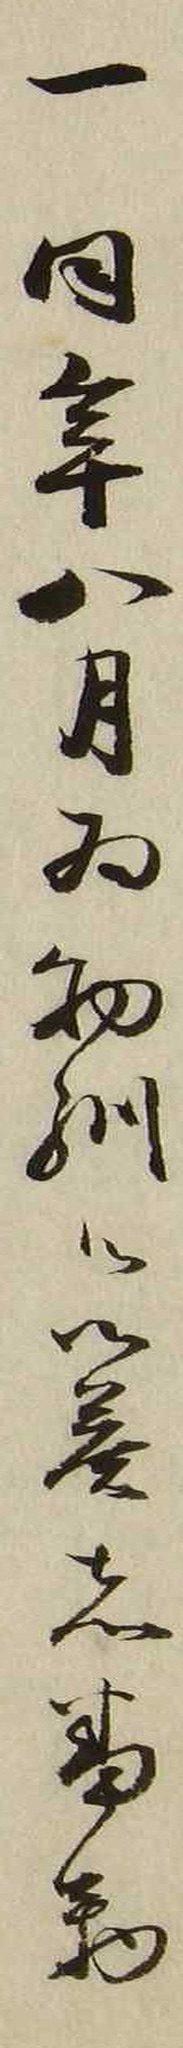一同年八月為物馴候御奏者番勤
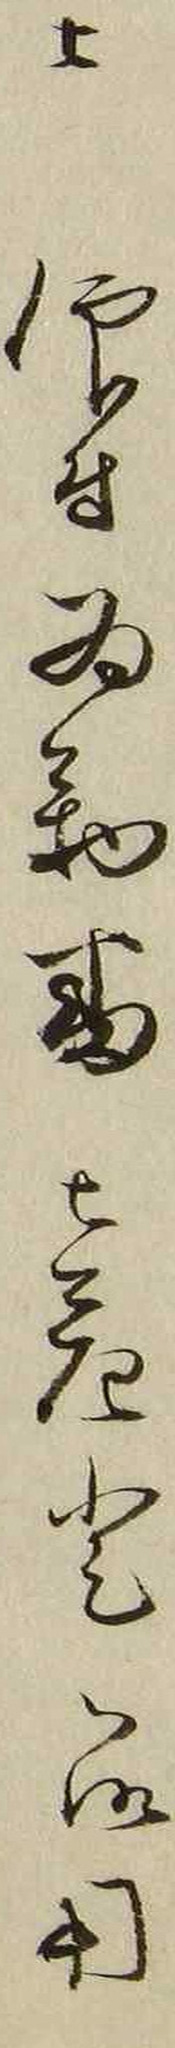被仰付為勤番被差登候御用
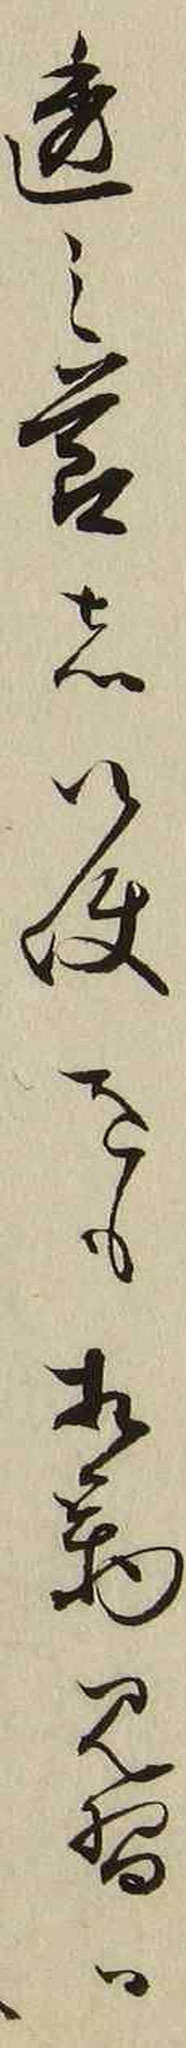達之節は御使をも相勤見習候
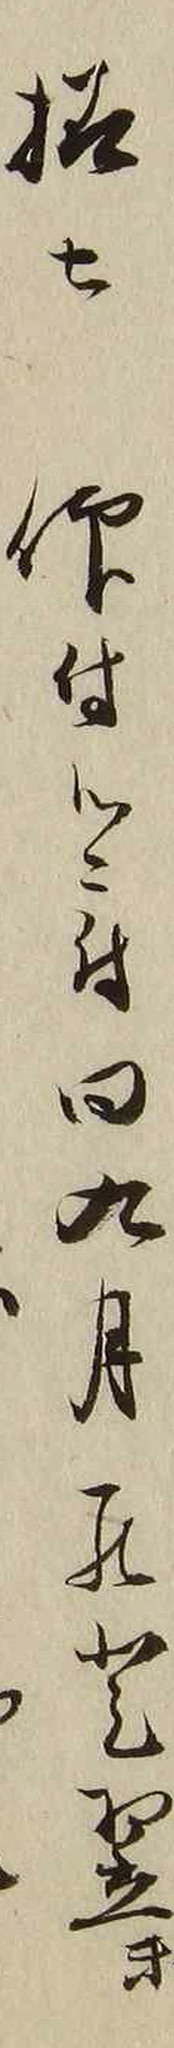様被仰付候に付同九月罷登翌未
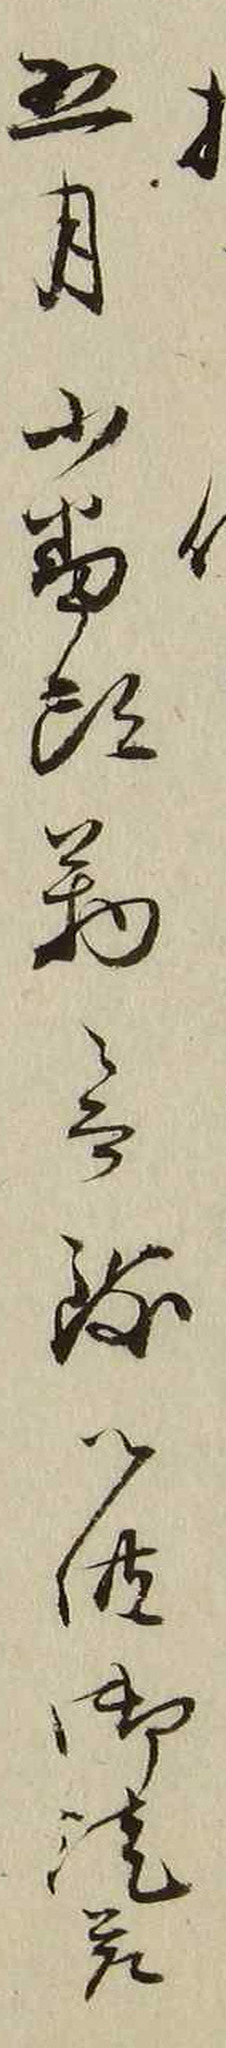五月小番頭勤に而致御供御徒差
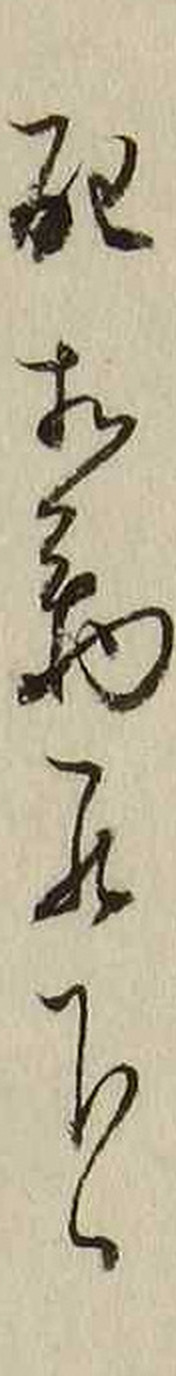配相勤罷下候
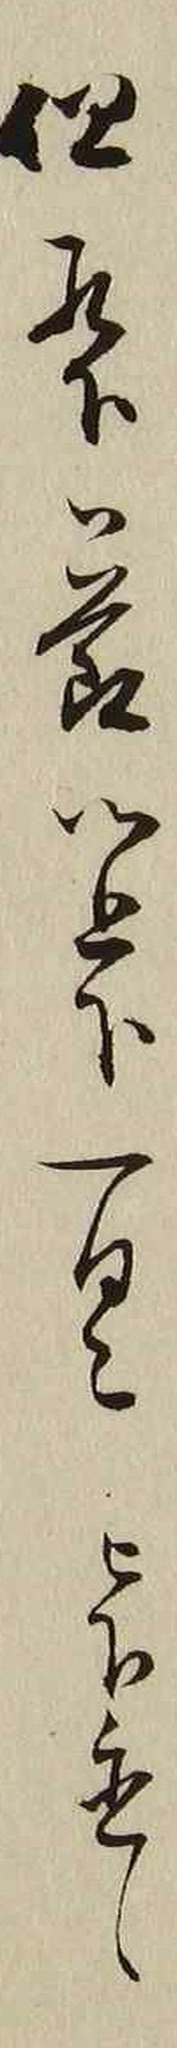但罷下候節御上下一具被下置候
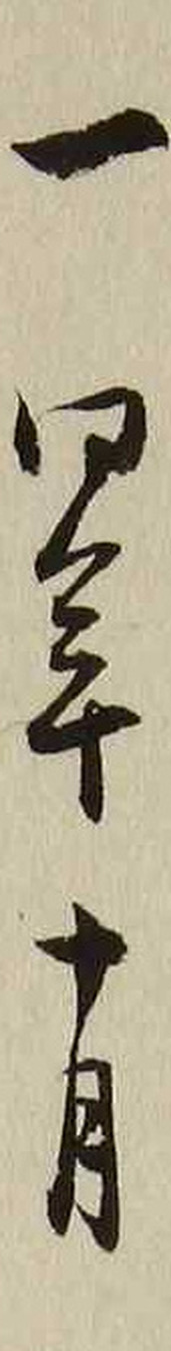一同年十月
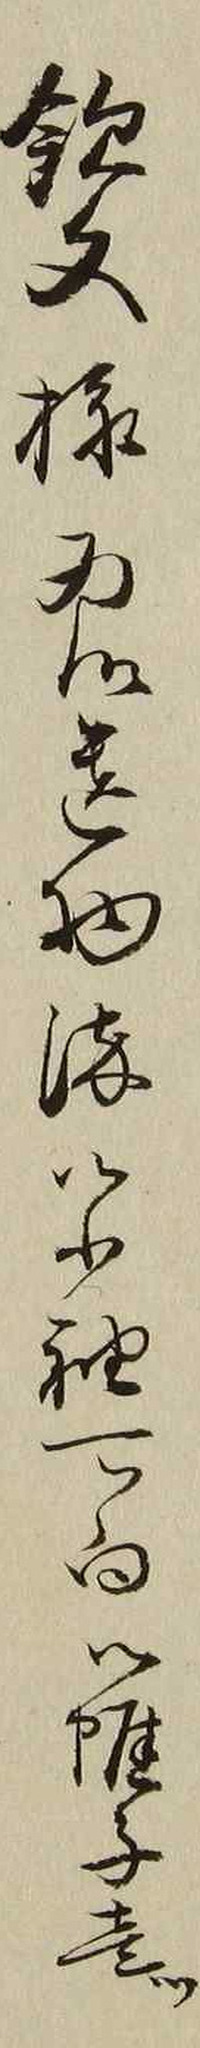欽文様御遺物継御小袖一つ白御帷子壱つ
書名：諸士系譜　巻之292　き之部1
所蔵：会津若松市立会津図書館
